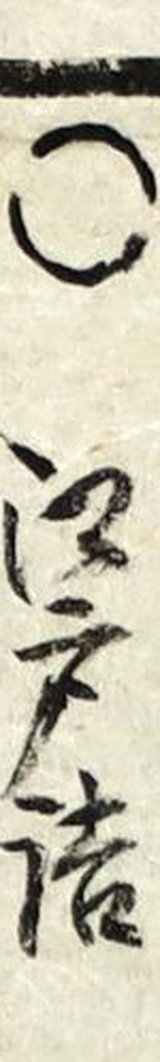○江戸詰
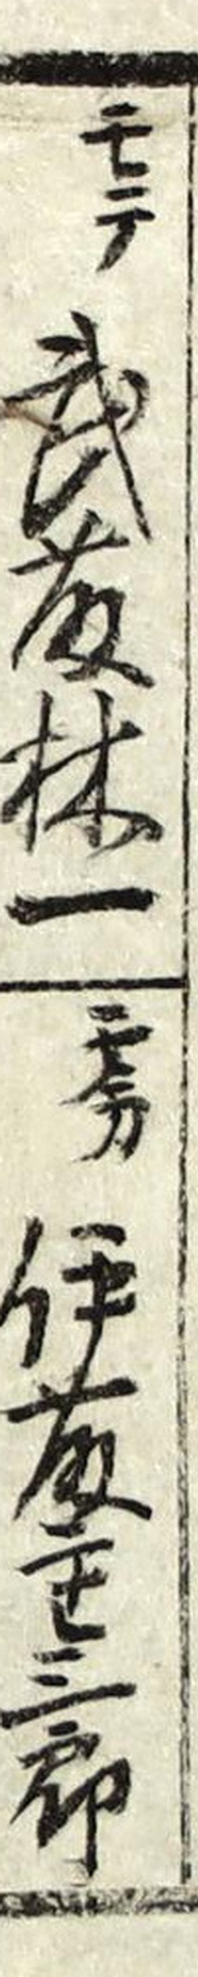モテ武藤林一モカ伊藤重三郎
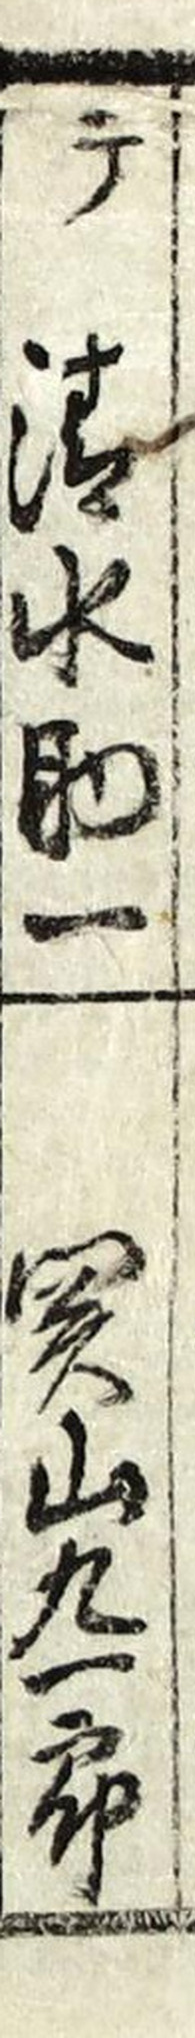テ清水助一関山九一郎
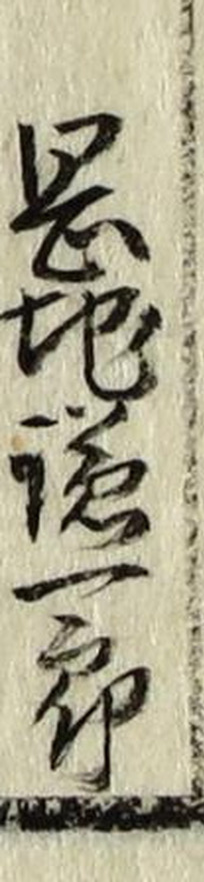岡地謙一郎
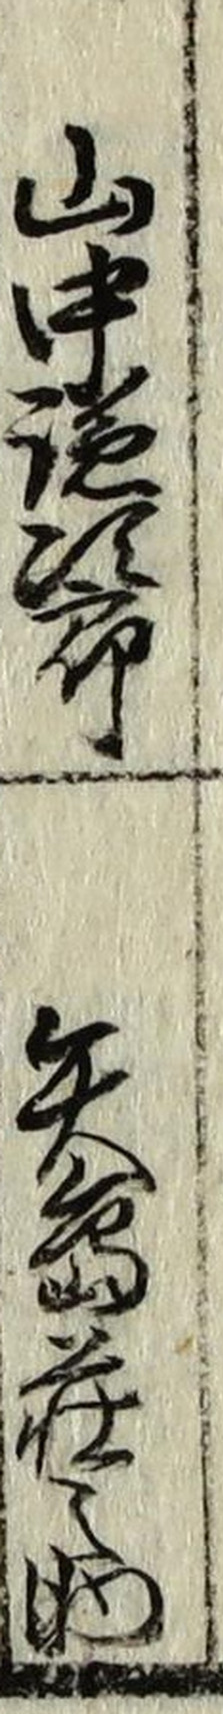山中謙次郎矢島荘之助
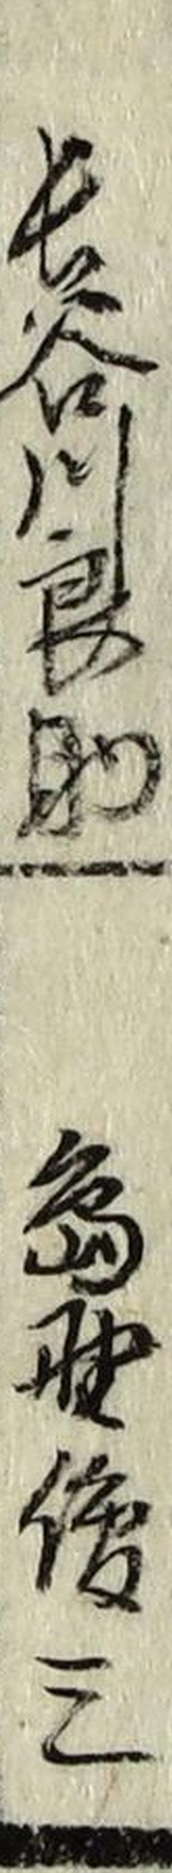長谷川良助島野俊三
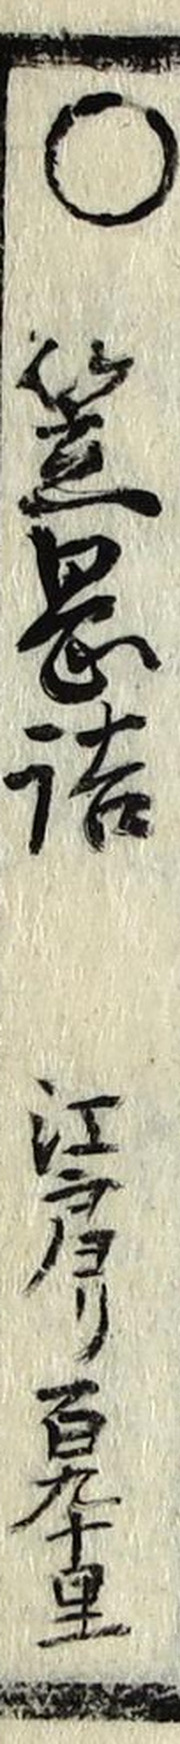○笠岡詰江戸ヨリ百九十里
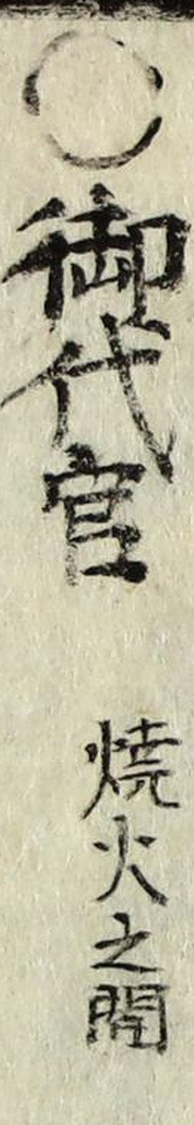○御代官焼火之間
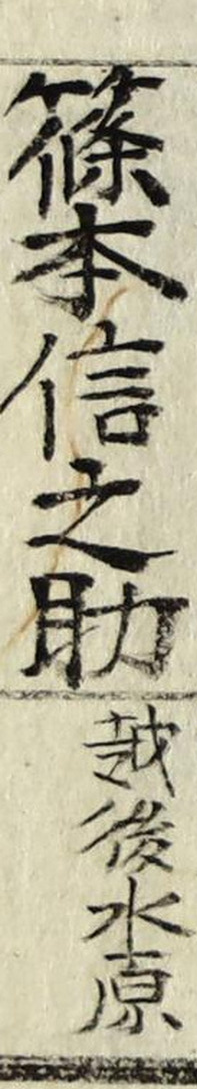篠本信之助越後水原
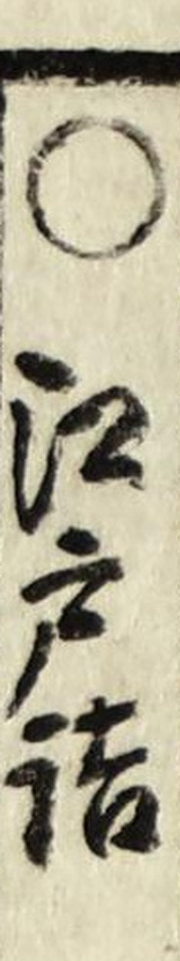○江戸詰
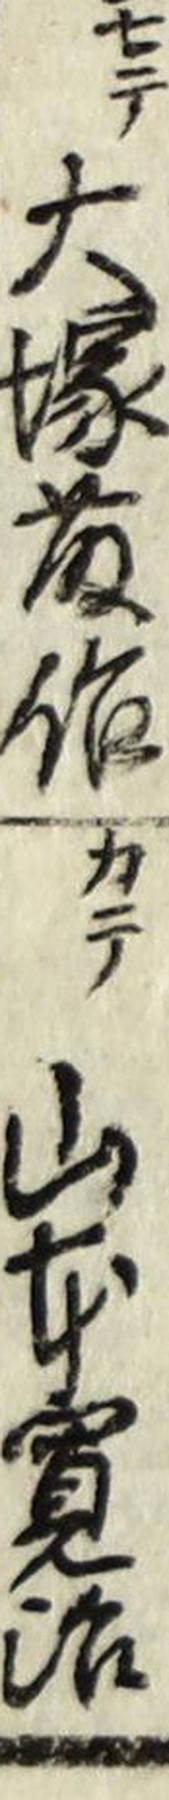モテ大塚藤作カテ山本寛治
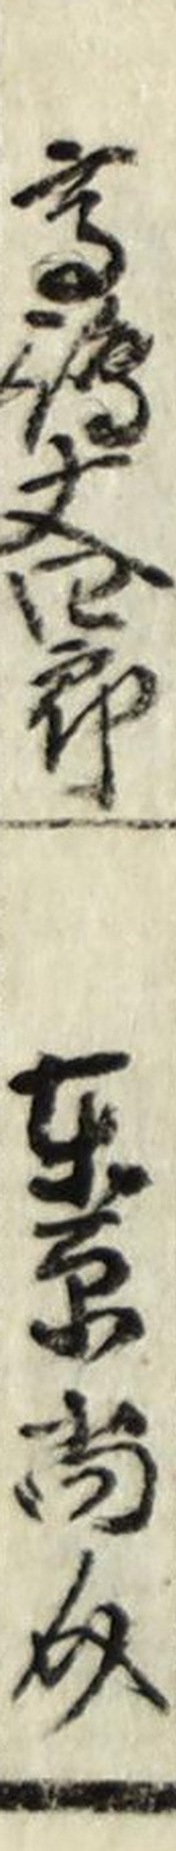高嶋丈四郎東原尚介
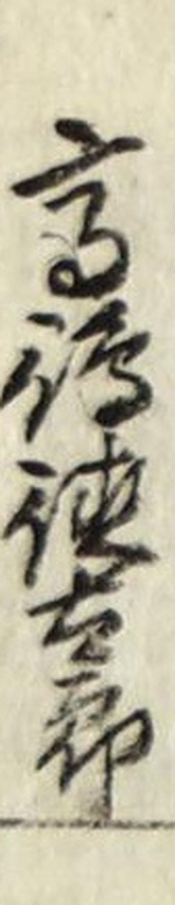高嶋徳太郎

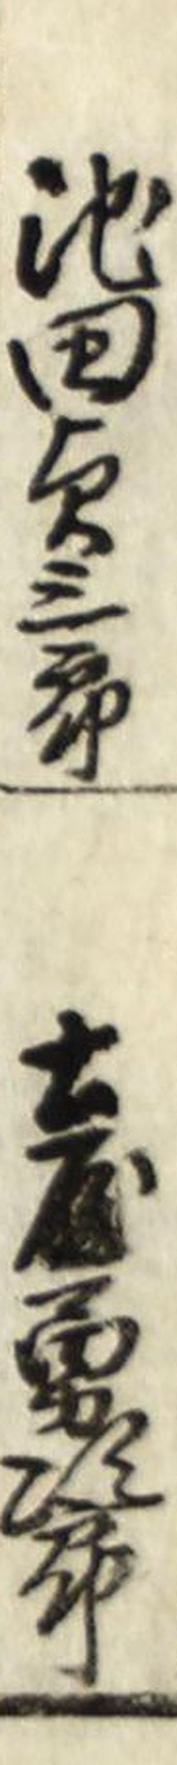池田貞三郎土屋勇次郎
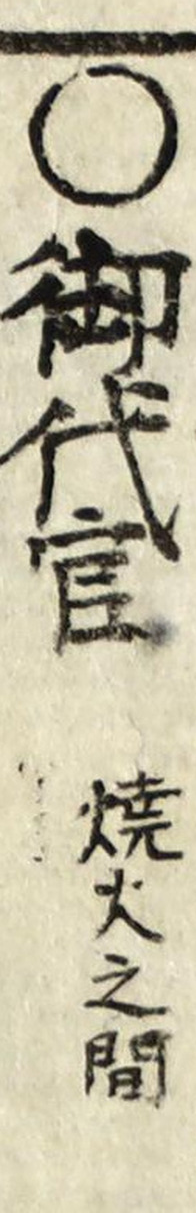○御代官焼火之間
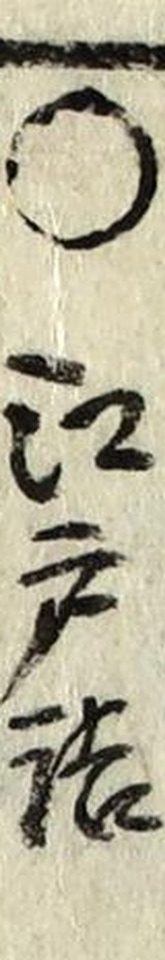○江戸詰
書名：（全国郡代・代官所諸役人名列）
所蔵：福井県文書館 Fukui Prefectural Archives
